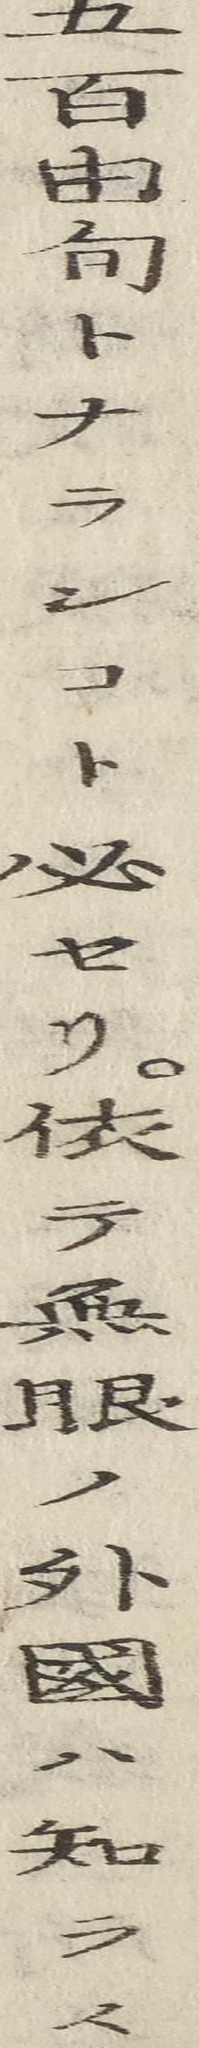五百由旬トナランコト必セリ。依テ魚眼ノ外国ハ知ラス
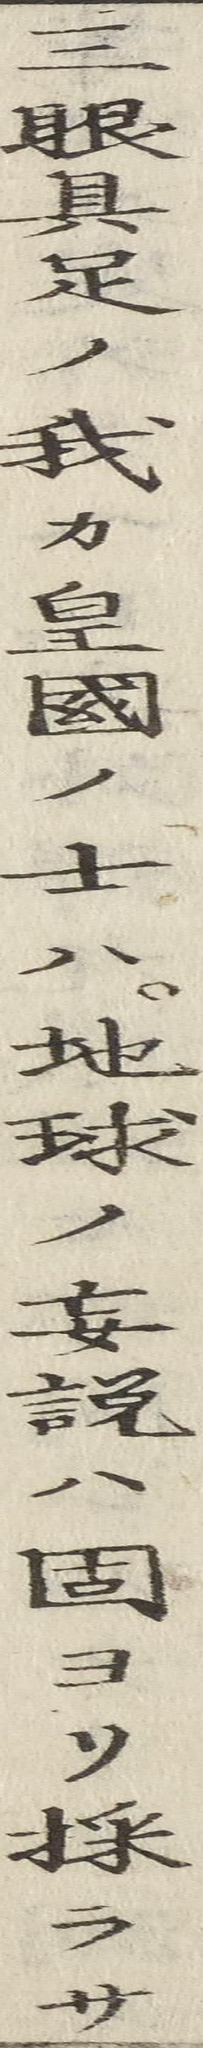三眼具足ノ我カ皇国ノ士ハ。地球ノ妄説ハ固ヨリ採ラサ
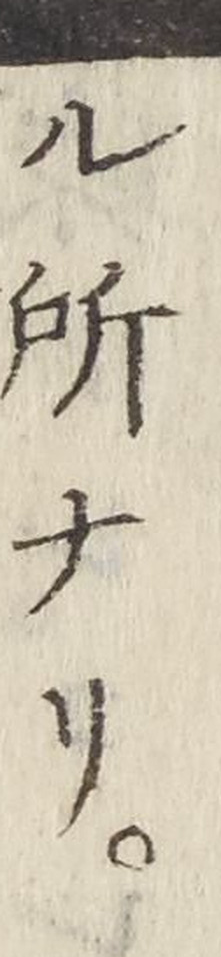ル所ナリ。
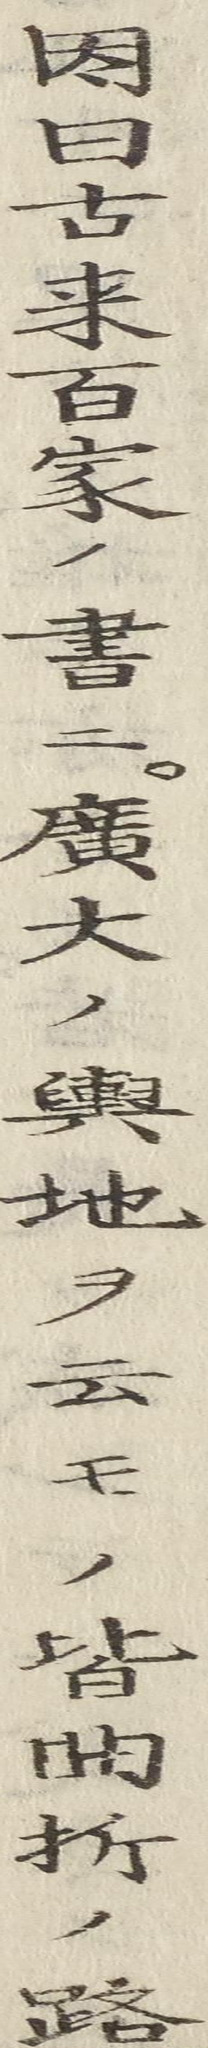因曰古来百家ノ書ニ。広大ノ輿地ヲ云モノ皆曲折ノ路
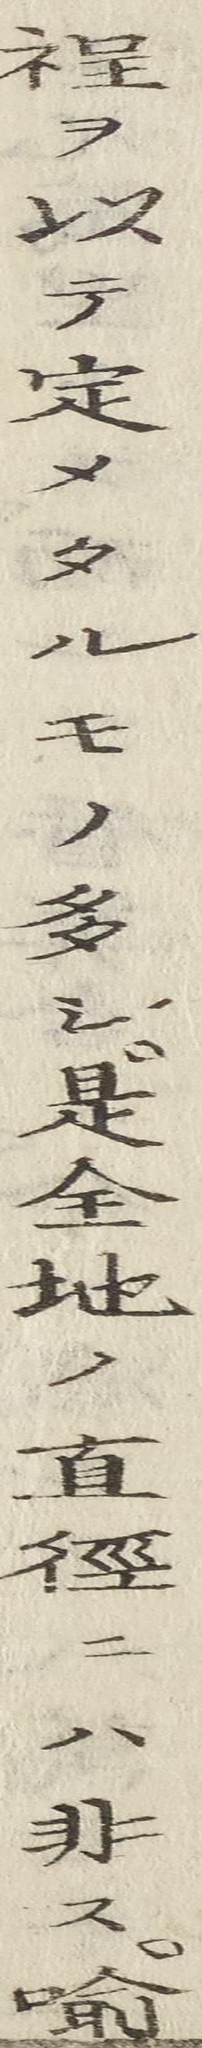程ヲ以テ定メタルモノ多シ。是全地ノ直径ニハ非ス。喩
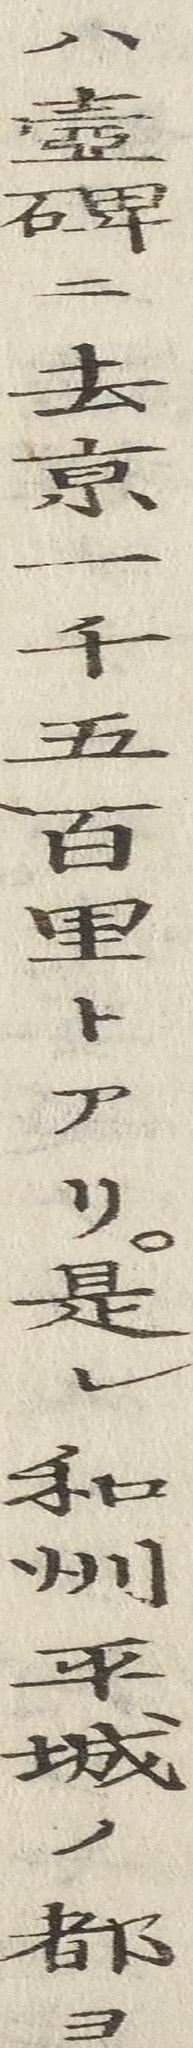ハ壷碑ニ去京一千五百里トアリ。是レ和州平城ノ都ヨ
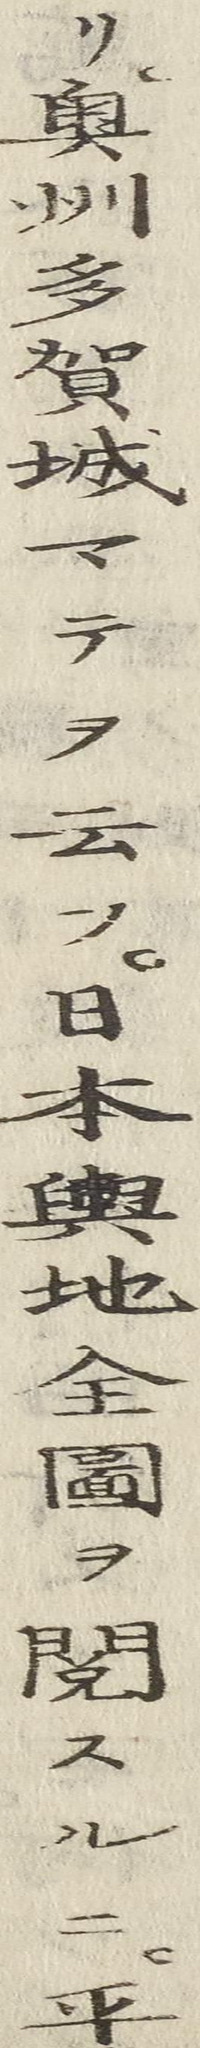リ。奥州多賀城マテヲ云フ。日本輿地全図ヲ閲スルニ。平
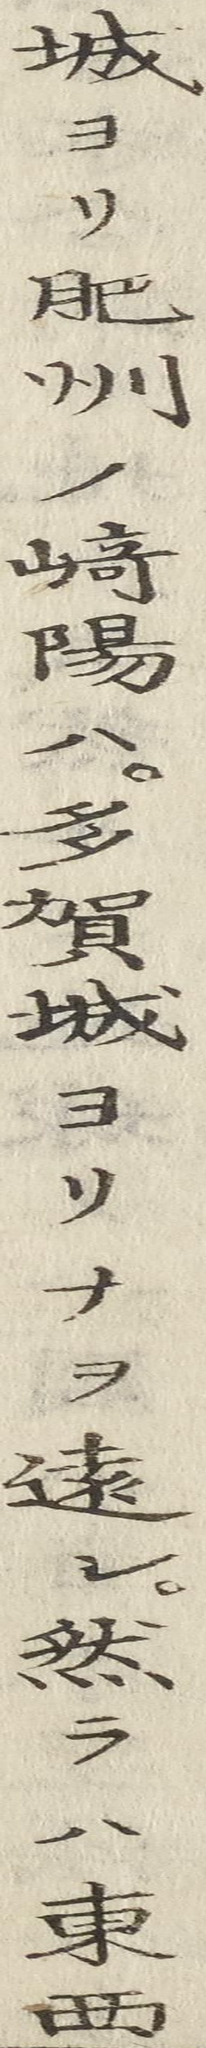城ヨリ肥州ノ崎陽ハ。多賀城ヨリナヲ遠シ。然ラハ東西
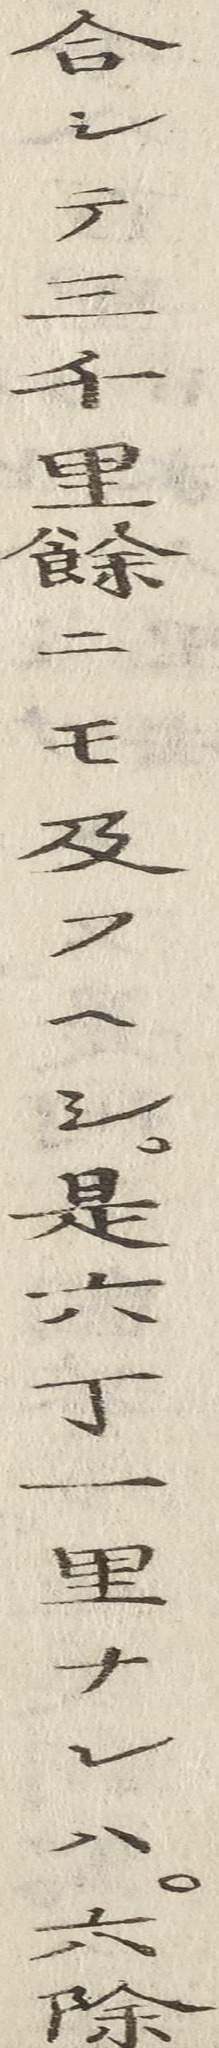合シテ三千里余ニモ及フヘシ。是六丁一里ナレハ。六除
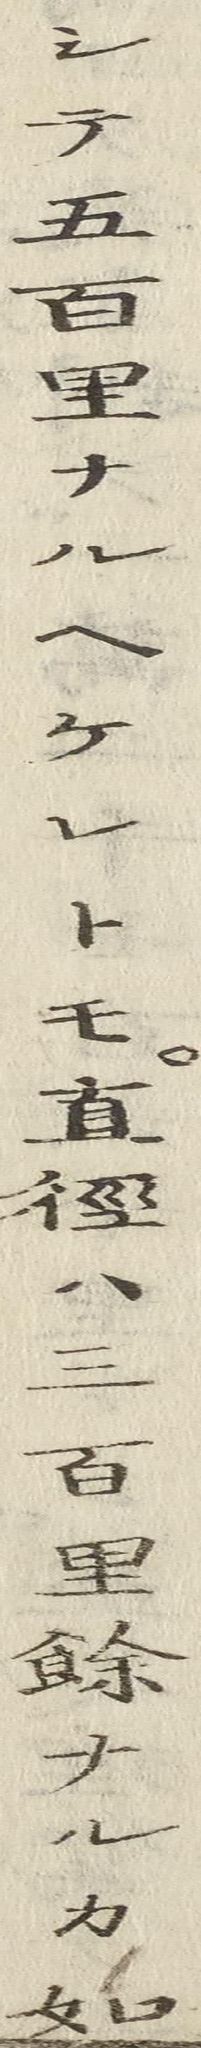シテ五百里ナルヘケレトモ。直径ハ三百里余ナルカ如
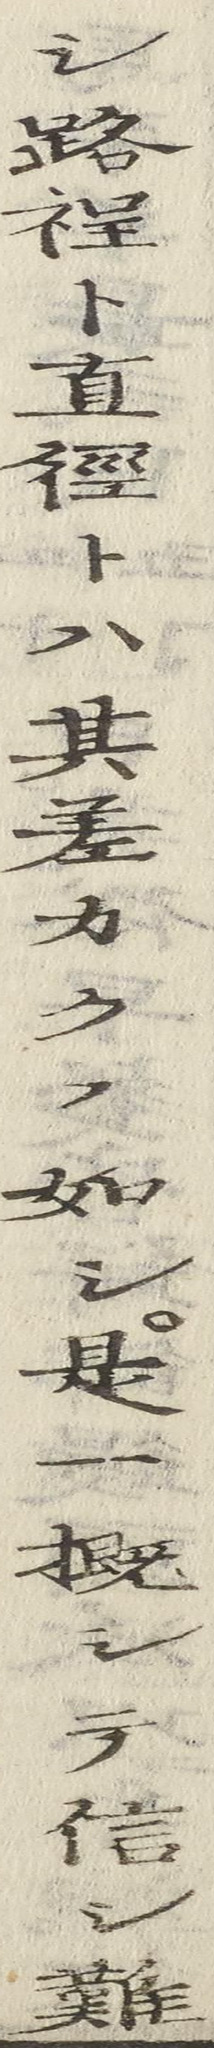シ路程ト直径トハ其差カクノ如シ。是一概シテ信シ難
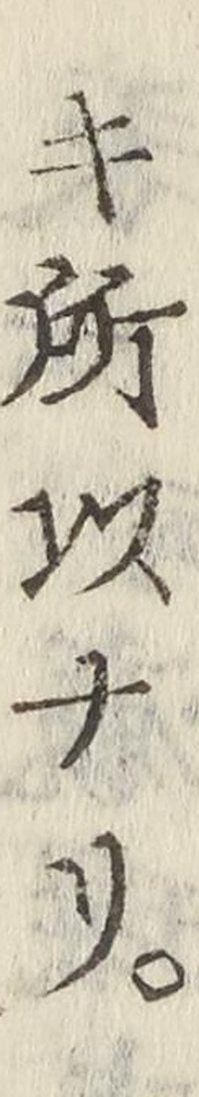キ所以ナリ。
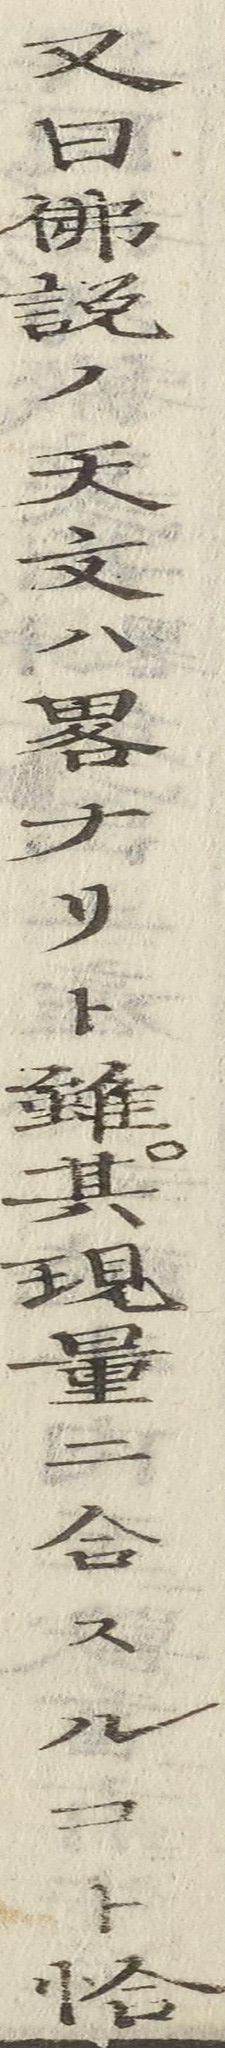又曰仏説ノ天文ハ略ナリト雖。其現量ニ合スルコト恰
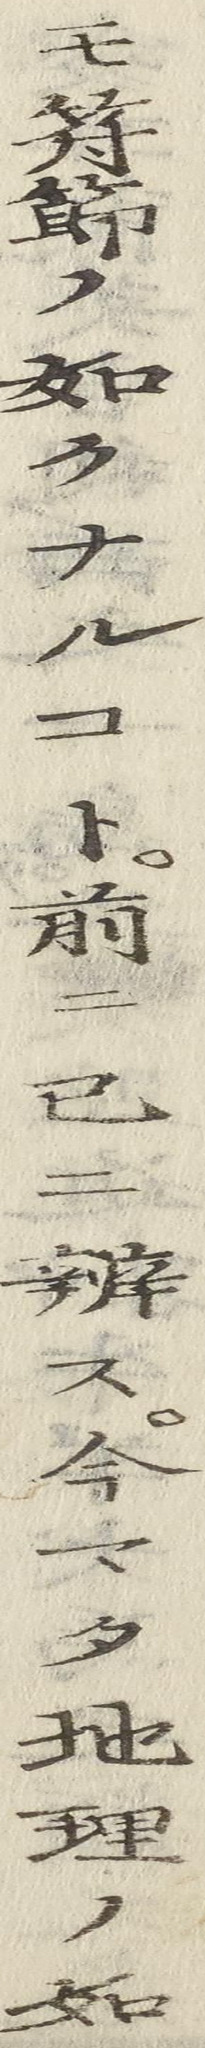モ符節ノ如クナルコト。前ニ已ニ弁ス。今マタ地理ノ如
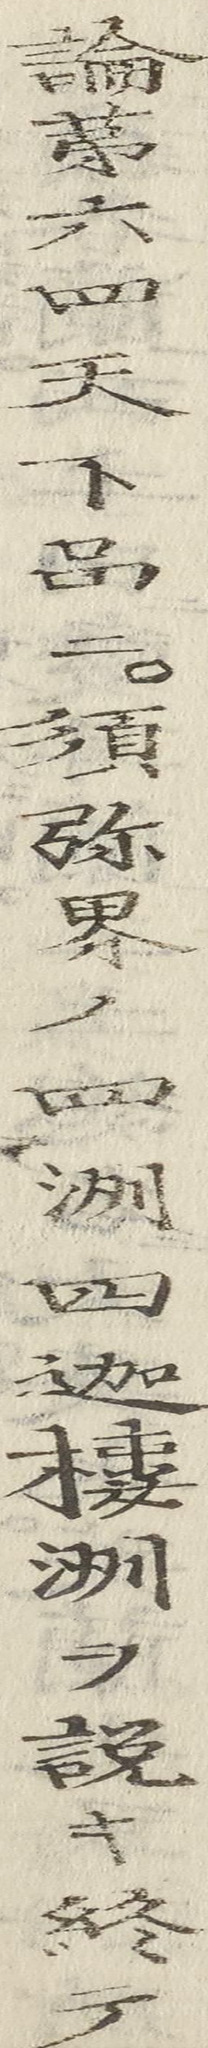論第六四天下品ニ。須弥界ノ四洲四迦楼洲ヲ説キ終テ
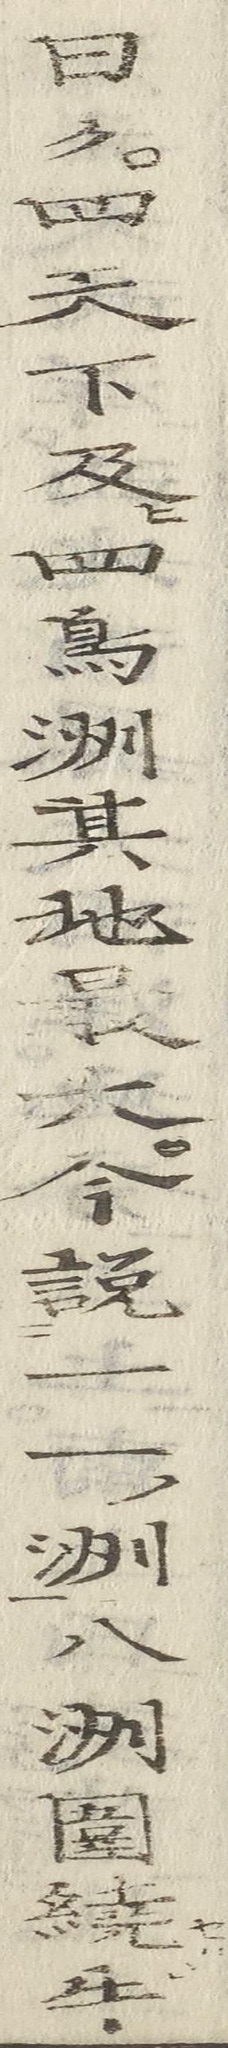曰ク。四天下及四鳥洲其地最大。今説ニ一一洲八洲囲繞牛
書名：護法新論　二編　中
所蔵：東京大学地震研究所図書室 Earthquake Research Institute Library, The University of Tokyo, JAPAN
